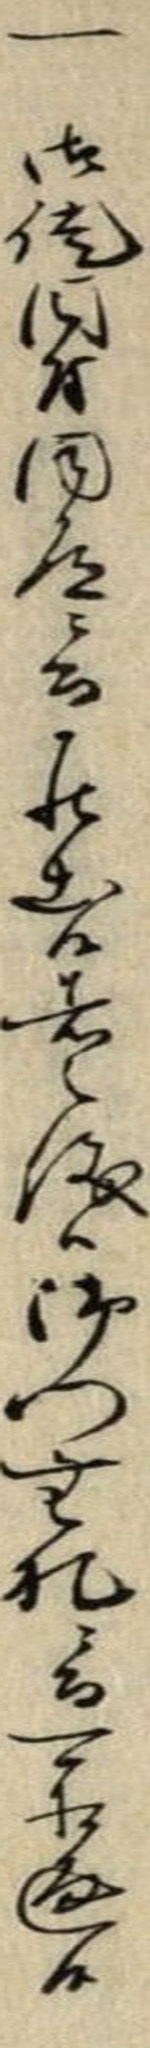一御徒目付同道にて罷出候者之儀は御門無札にて可相通候
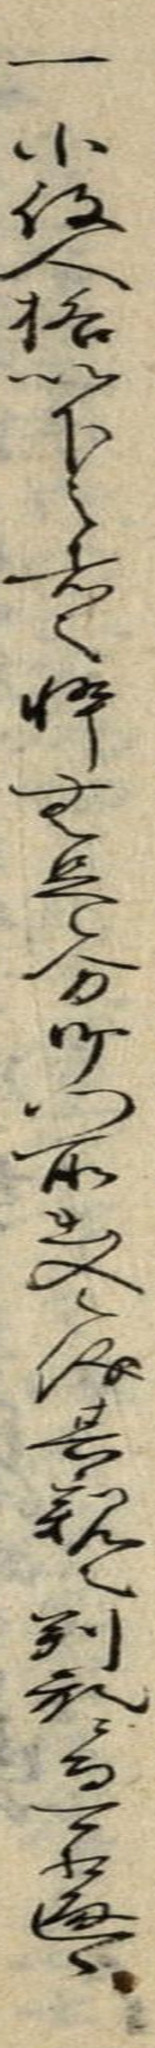一小役人格以下之者之忰無足之分御門所出入之儀其親之判形にて可相通候
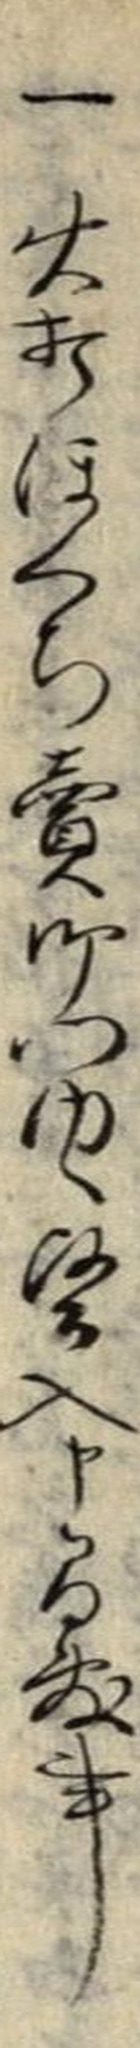一火打ほくち売御門内へ堅入申間敷事
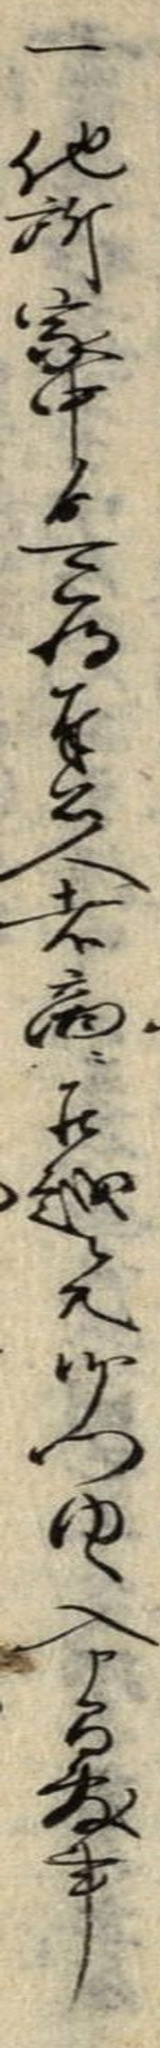一他所家中ゟ可為奉公人者商に罷越候共御門内へ入申間敷事
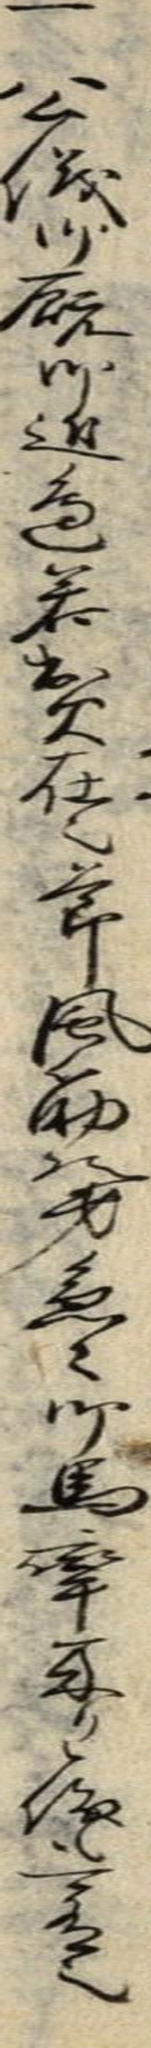一公儀御厩御近辺若出火在之節風筋次第急々御馬牽来り候義も可有之
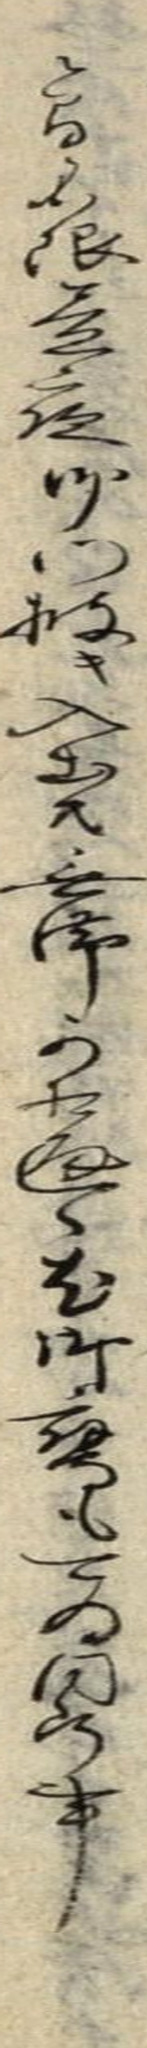候間不限昼夜御門被き入出共無滞可相通候尤御鷹も可為同断事
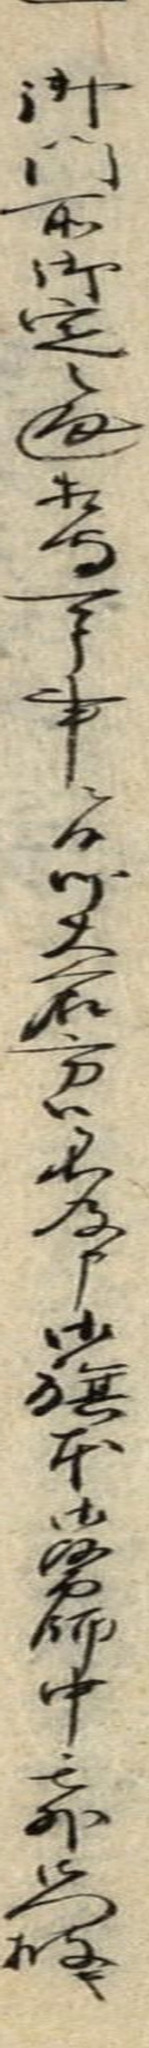一御門所御定之通相守可申事に候御大名方は不及申御旗本中其外御門被き
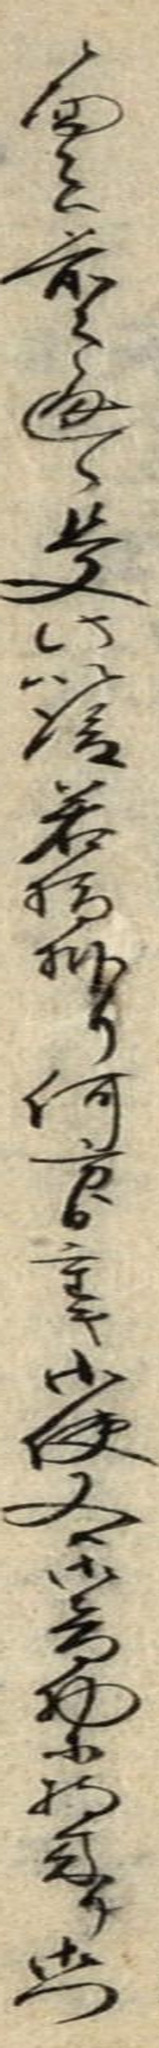候面々は前々之通候且又此以後若差掛り何方ゟ重き御使又は御音物等持来り御門
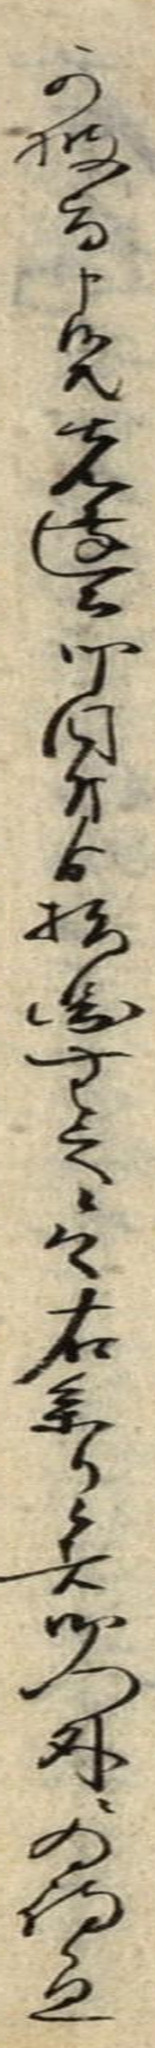可被旨申候共先達て御目付ゟ指図無之候はゝ右参り候者御門外に為待置
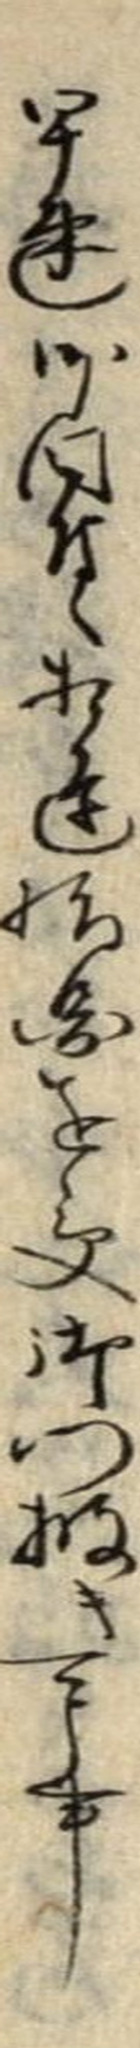早速御目付へ相達指図を受御門被き可申事
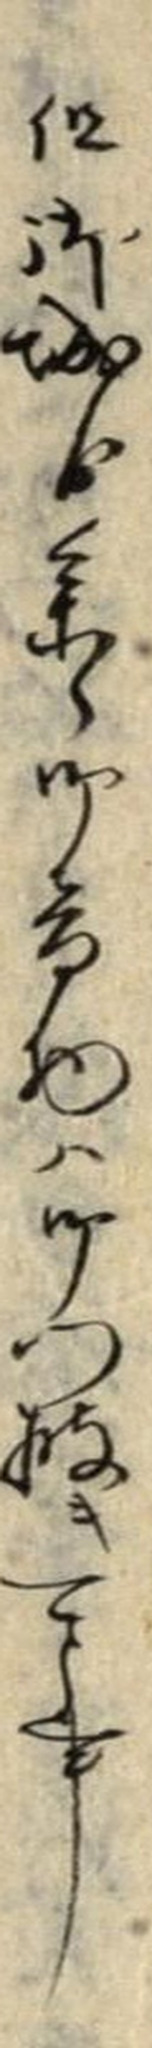但御城ゟ参候御音物は御門被き可申事

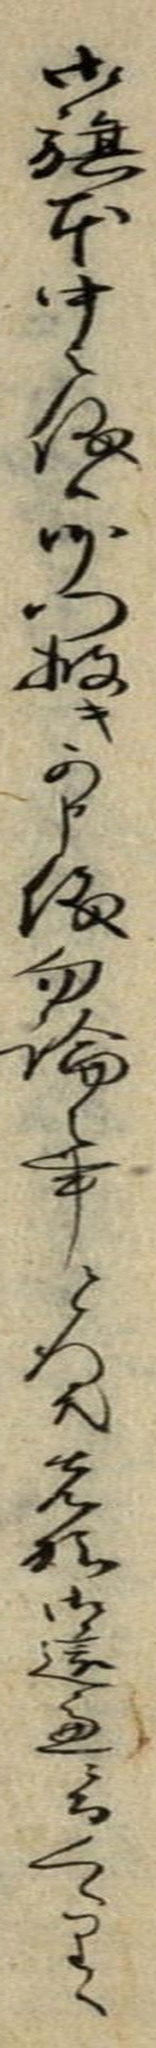一御旗本中之儀は御門披き可申儀勿論之事に候得共先様御遠慮にてくゝりへ
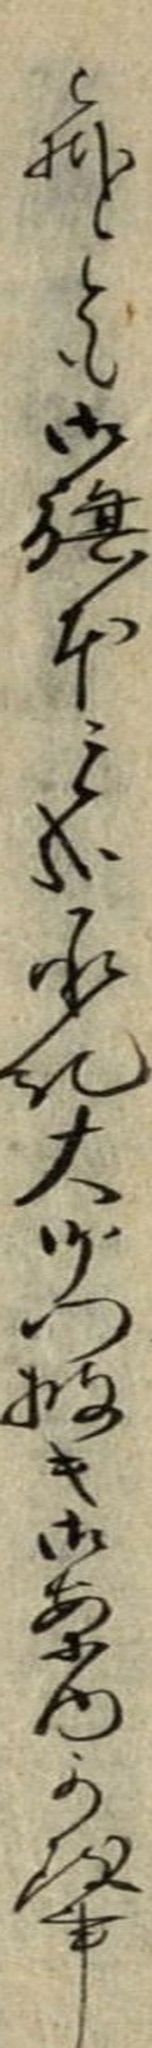被掛候とも御旗本に候哉承糺大御門披き御案内可致事
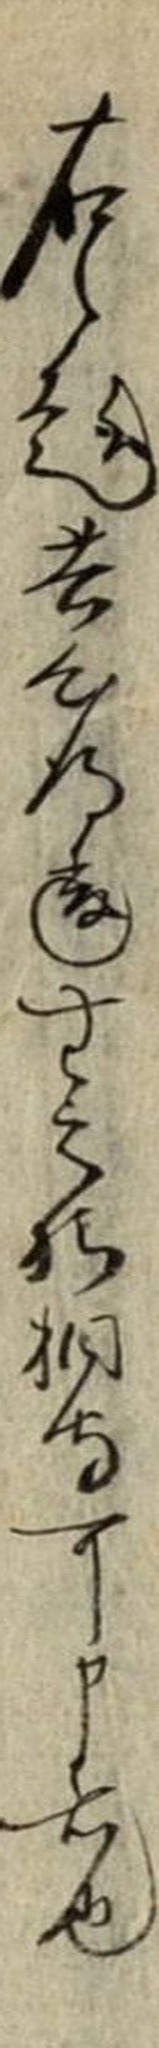右之趣共心得違無之様相守可申者也
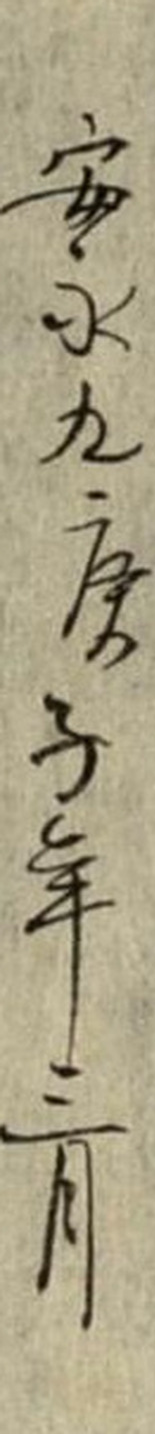安永九庚子年三月
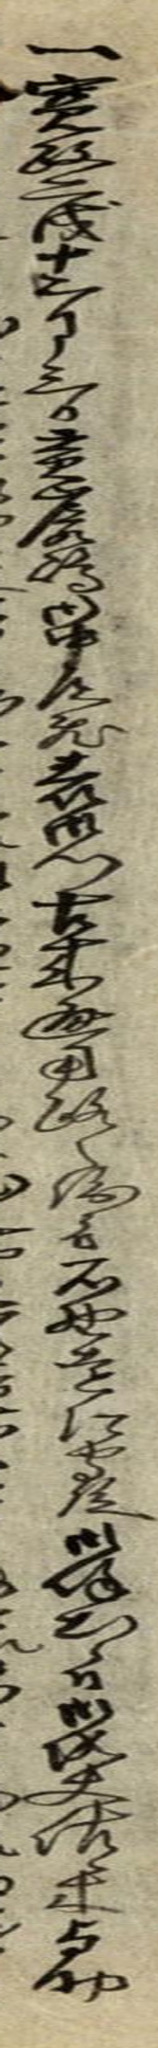一寛政二戌十二月三日霊巌嶋御中屋敷表御門古来通用路之儀に付石野遠江守殿御呼出候付御城使佐々木与助
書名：三都并道中之部
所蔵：福井県文書館 Fukui Prefectural Archives
